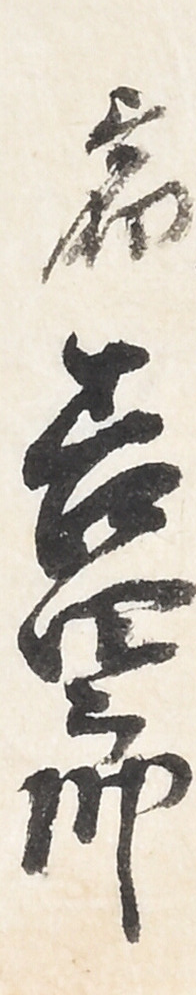宿吉四郎
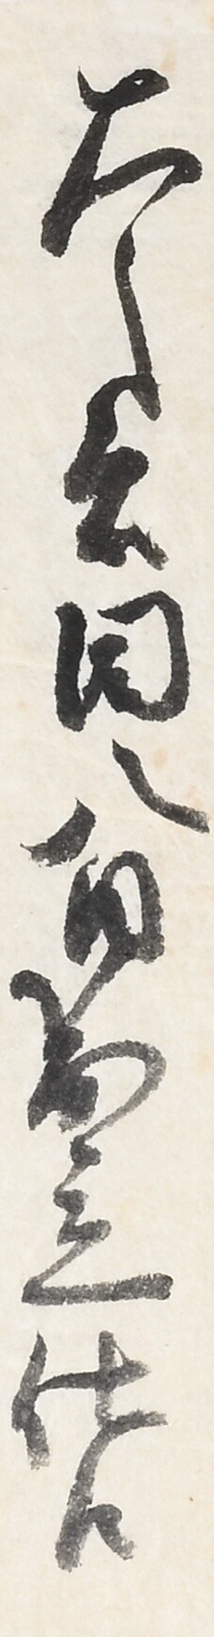右之者同八日出立仕候
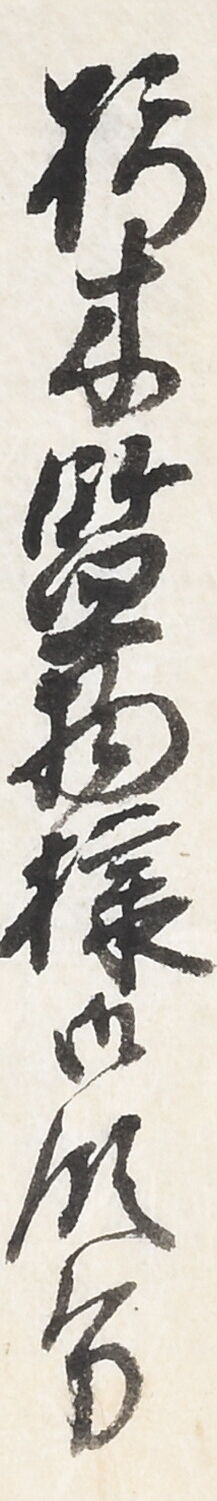松本監物様御領分
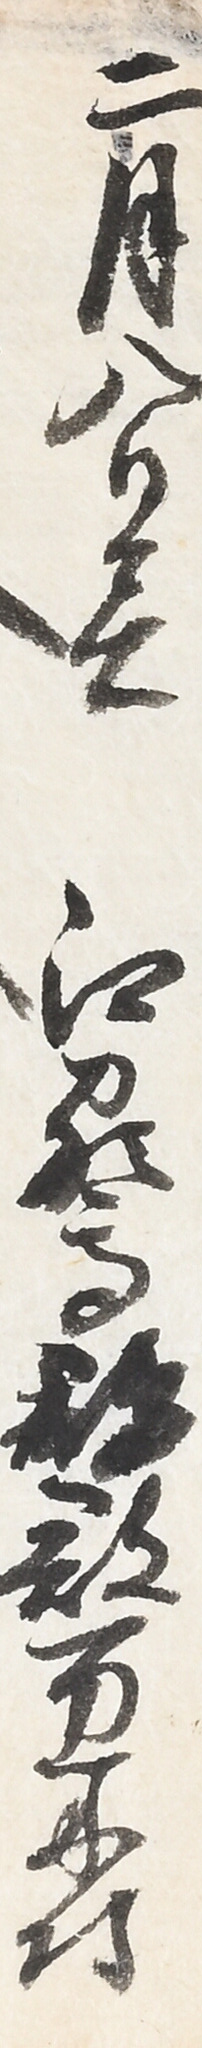二月八日昼江州高嶋郡万木村
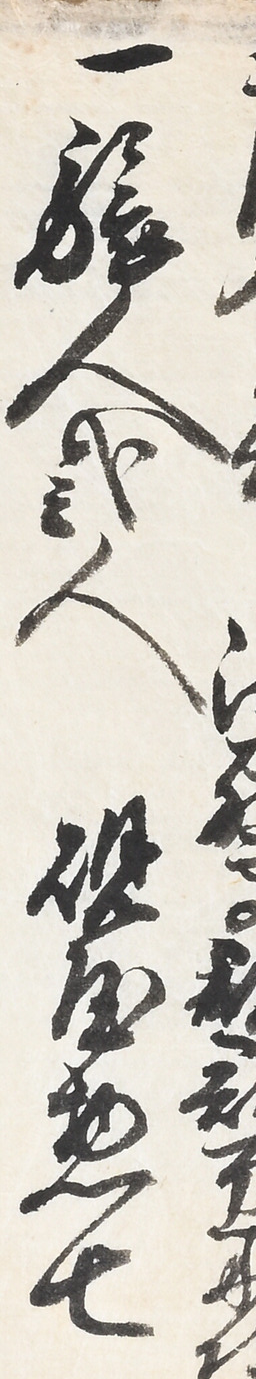一旅人弐人硯屋惣七
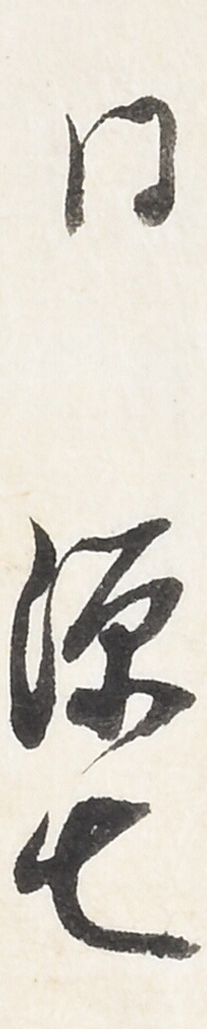同源七
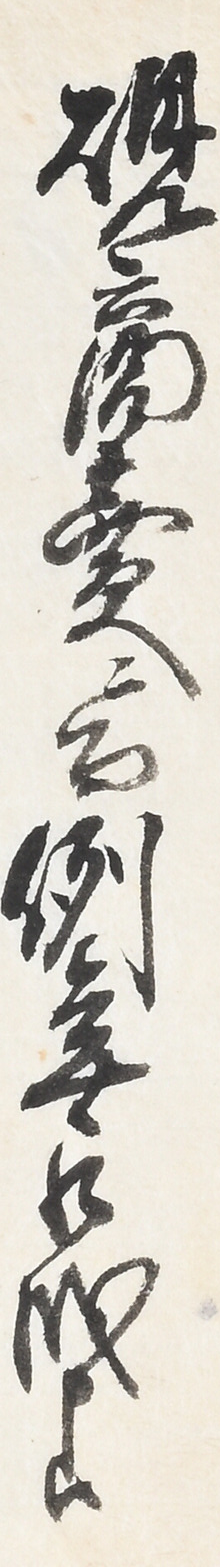硯商売ニ而例年罷越申候
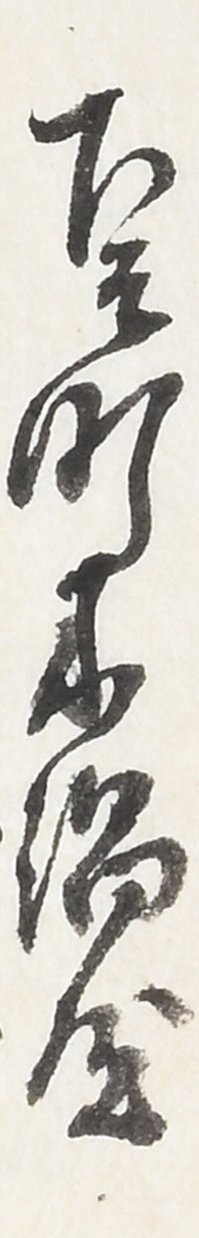下モ町木鍋屋
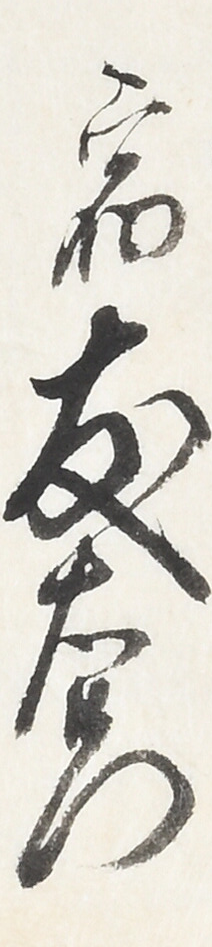宿友右衛門
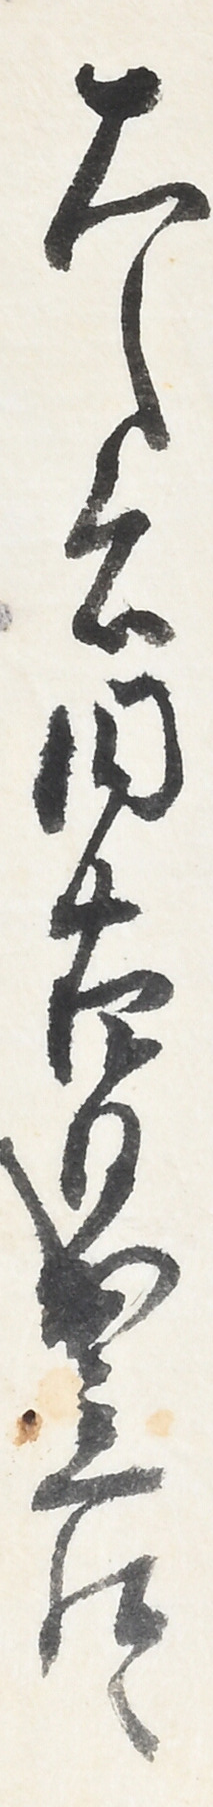右之者同八日出立仕候
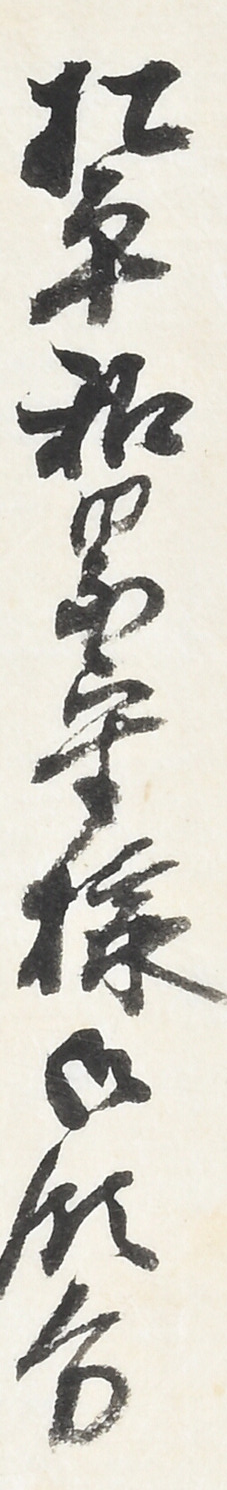松平和泉守様御領分
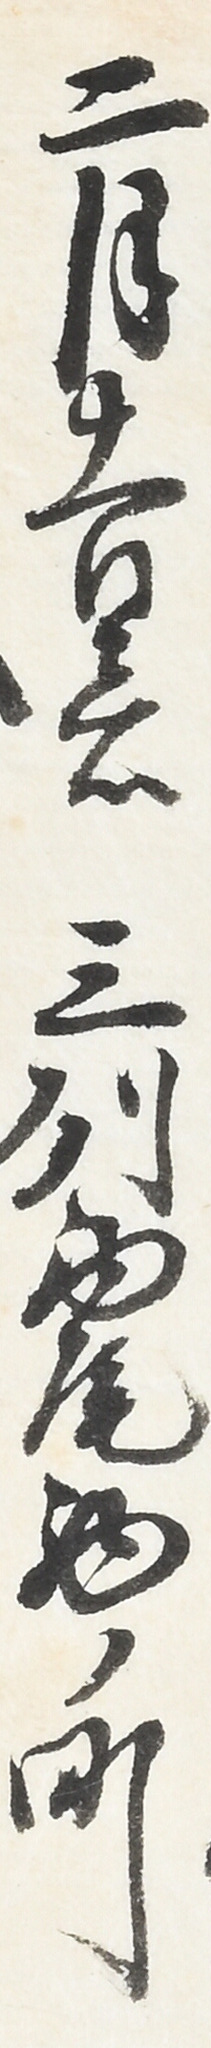二月十一日着三州西尾西ノ町
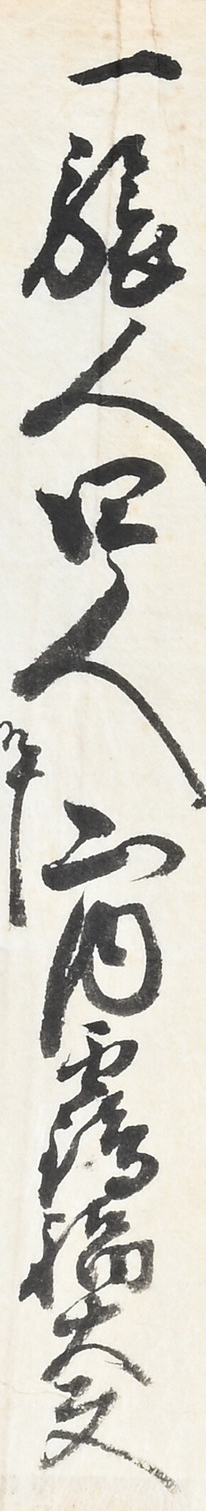一旅人四人山内靏福太夫
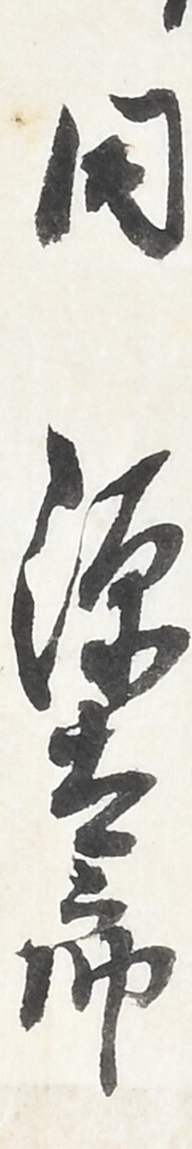同源太郎
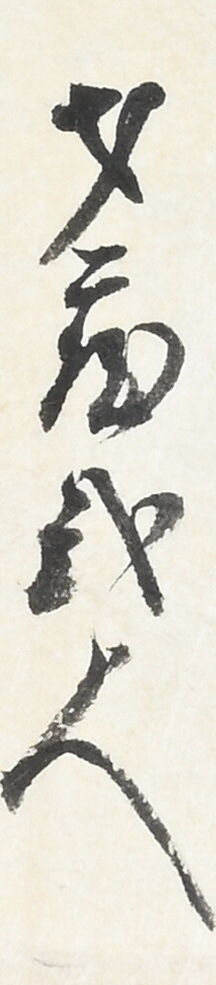才蔵弐人
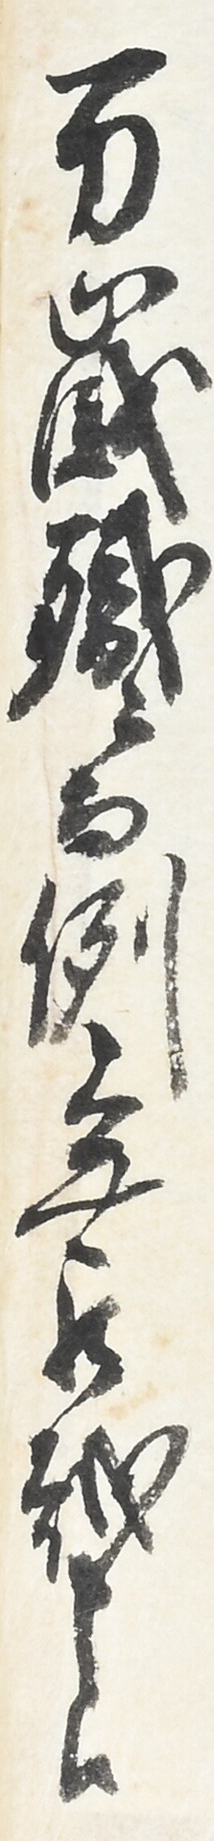万歳職ニ而例年罷越申候
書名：旅人泊控帳
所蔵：伊那市立高遠町図書館・合同会社AMANE
